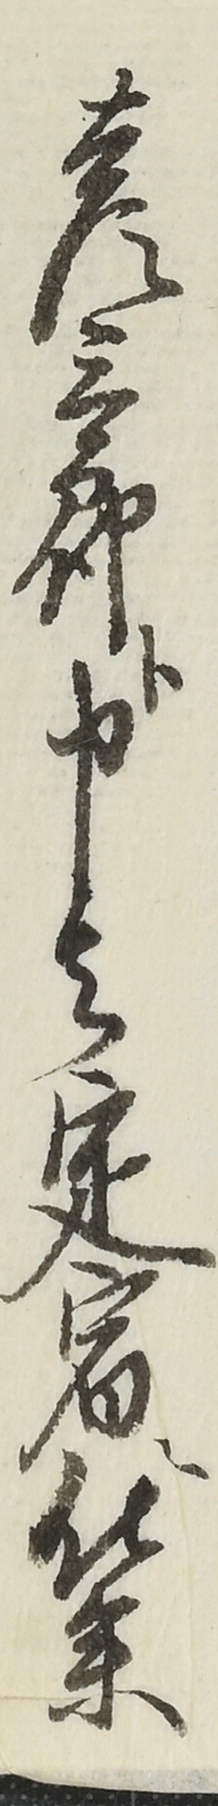彦三郎申者定宿ニ仕参

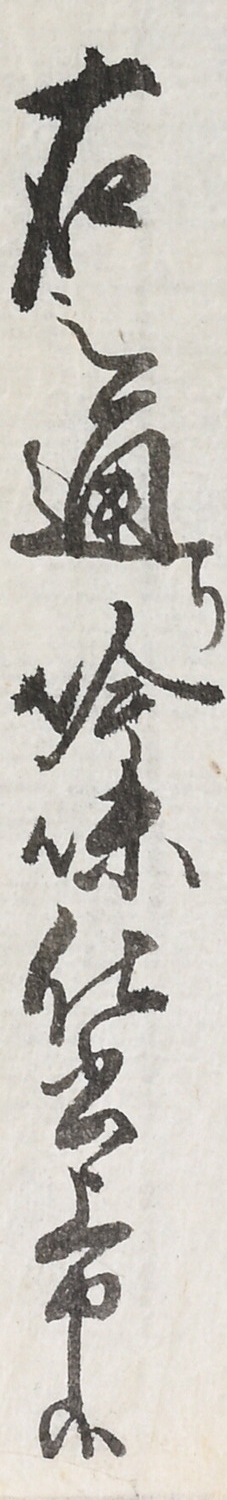右之通り吟味仕書上申候
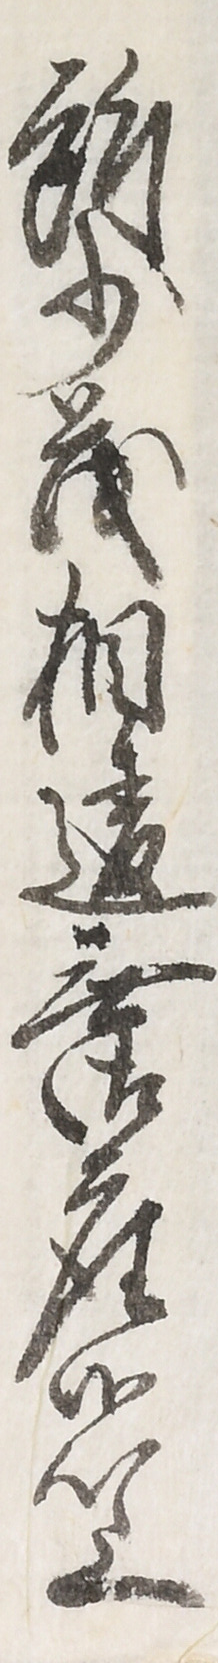所少も相違無御座候以上
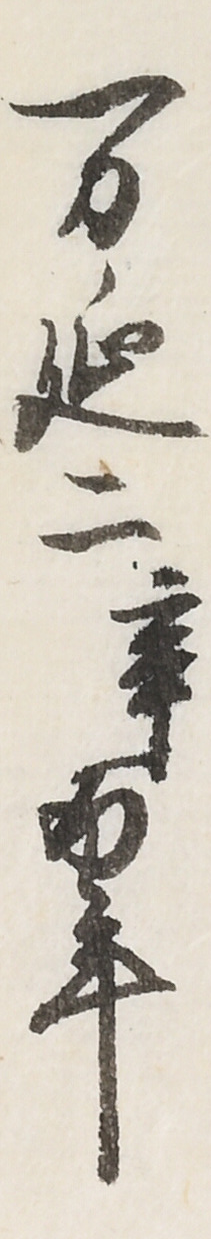万延二辛酉年
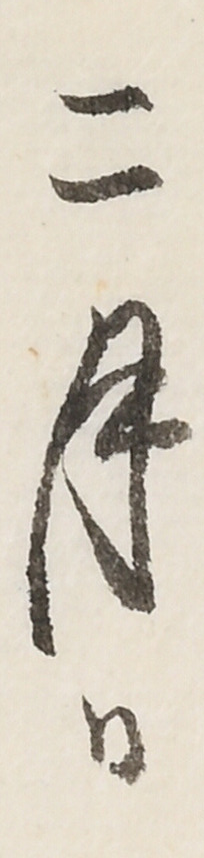二月日
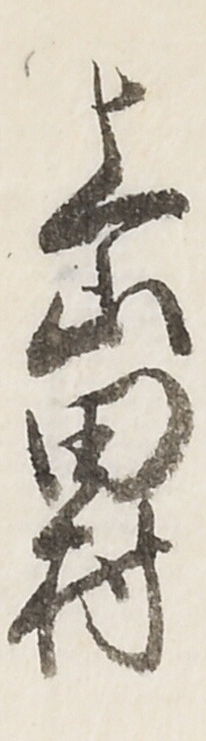上山田村
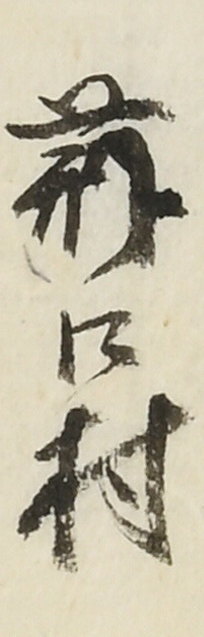荊口村
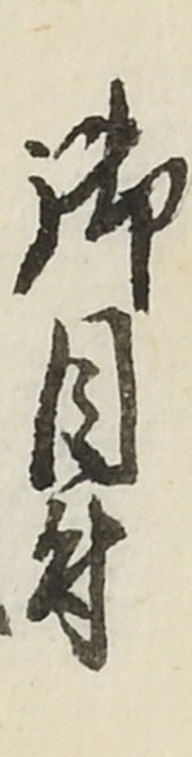御目付
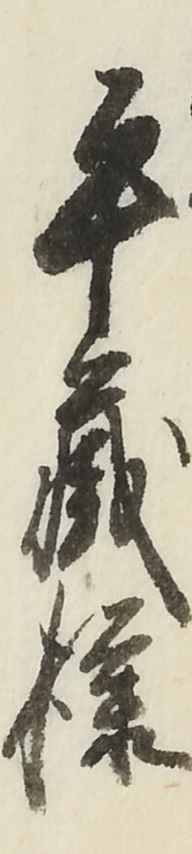平蔵様
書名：万延二辛酉年二月日他國石切稼書上帳
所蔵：伊那市立高遠町図書館・合同会社AMANE
